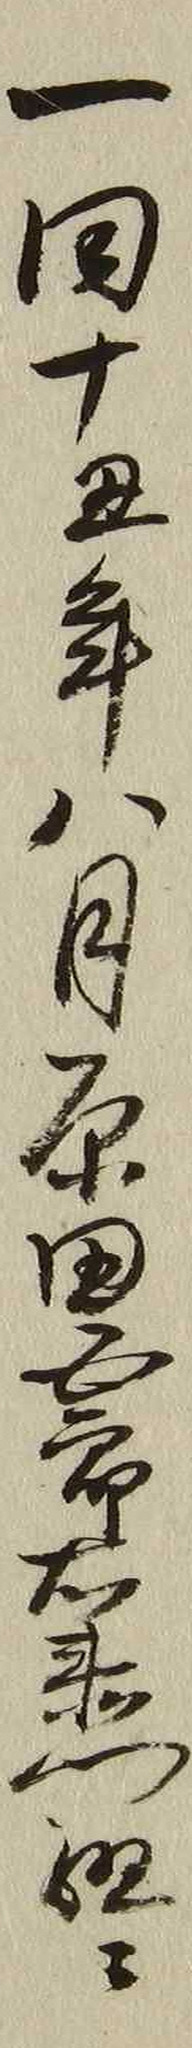一同十丑年八月原田五郎右衛門組ニ
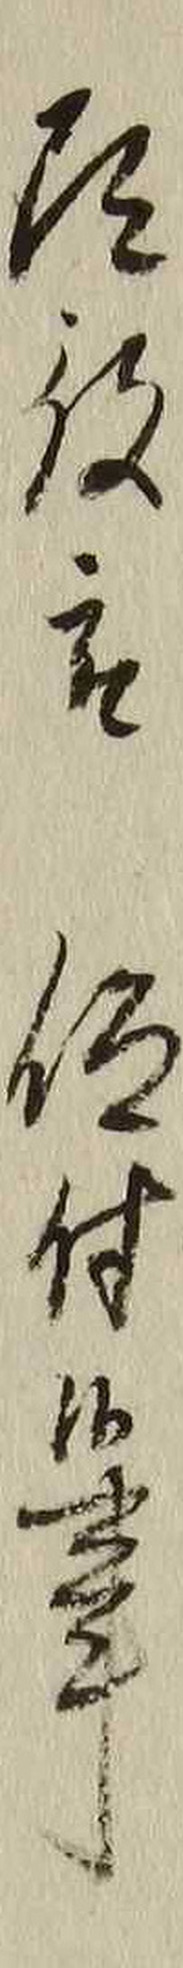頭役被仰付候事
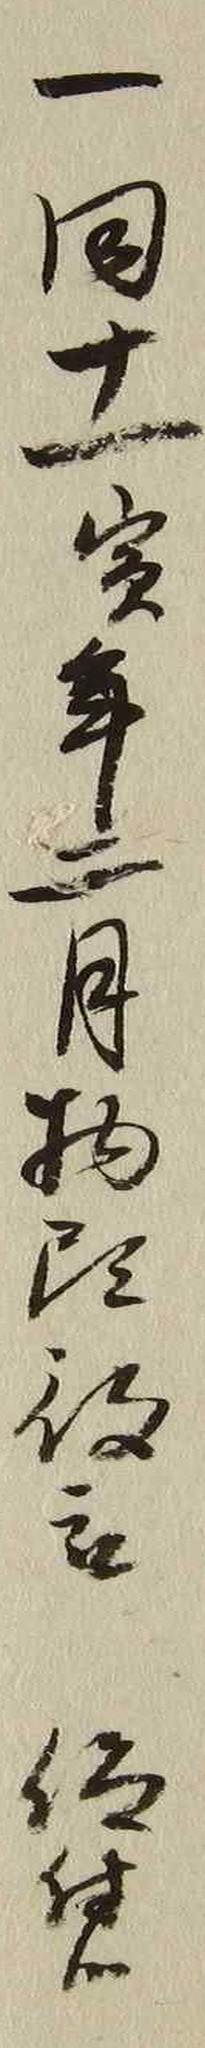一同十一寅年二月物頭役被仰付候
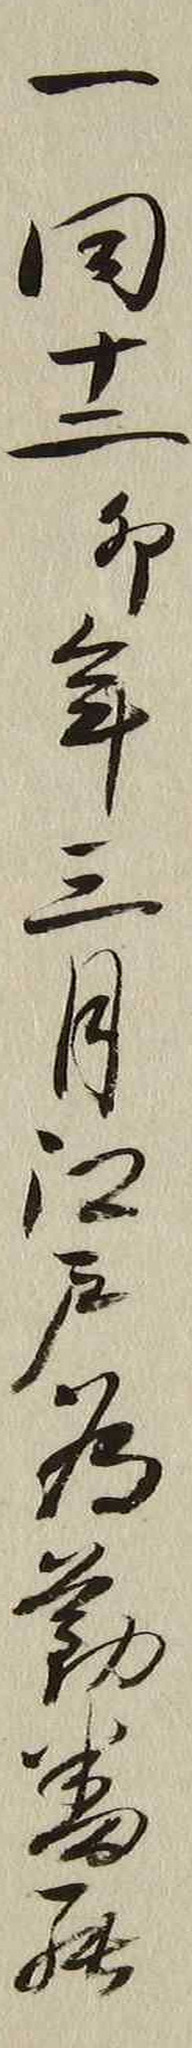一同十二卯年三月江戸為勤番罷
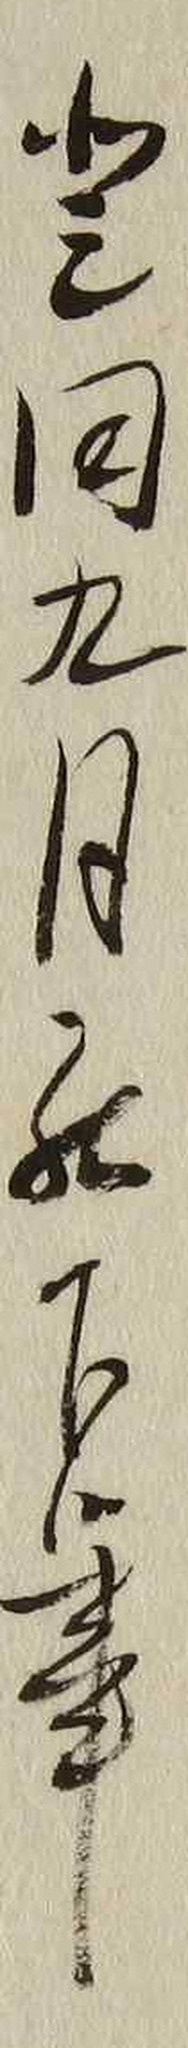登同九月罷下候事
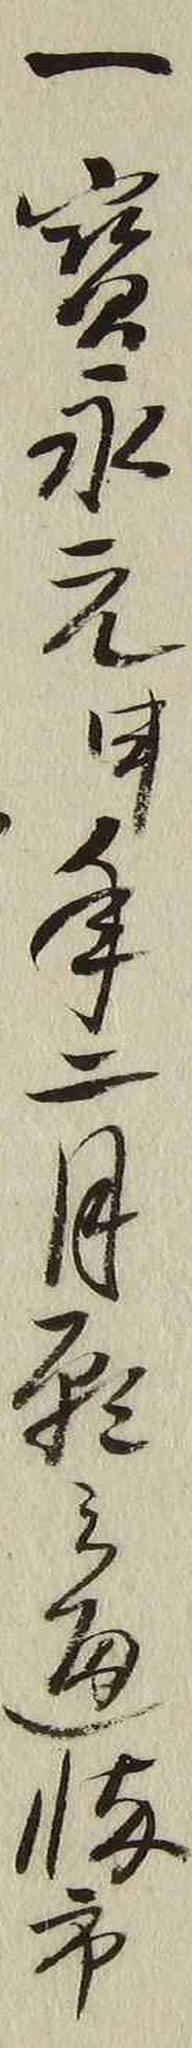一宝永元申年二月願之通忰市
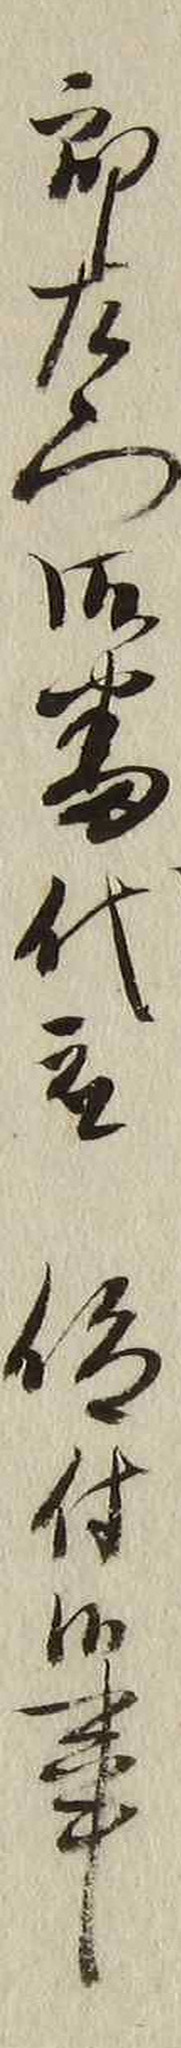郎左衛門御番代被仰付候事
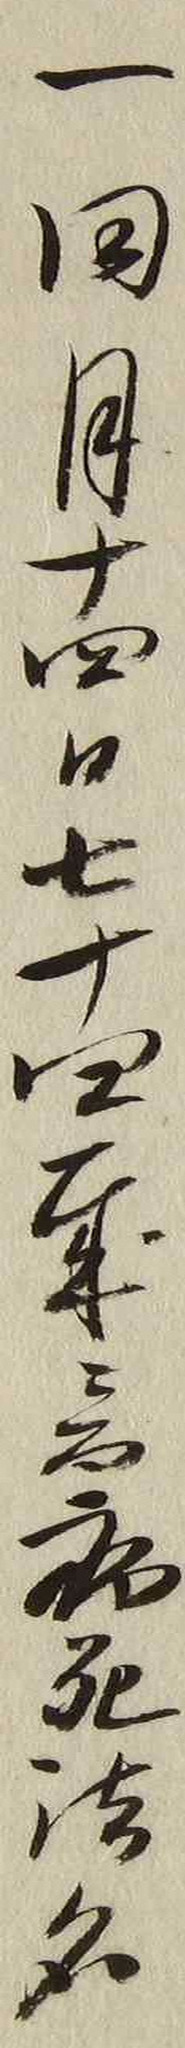一同月十四日七十四歳ニ而病死法名
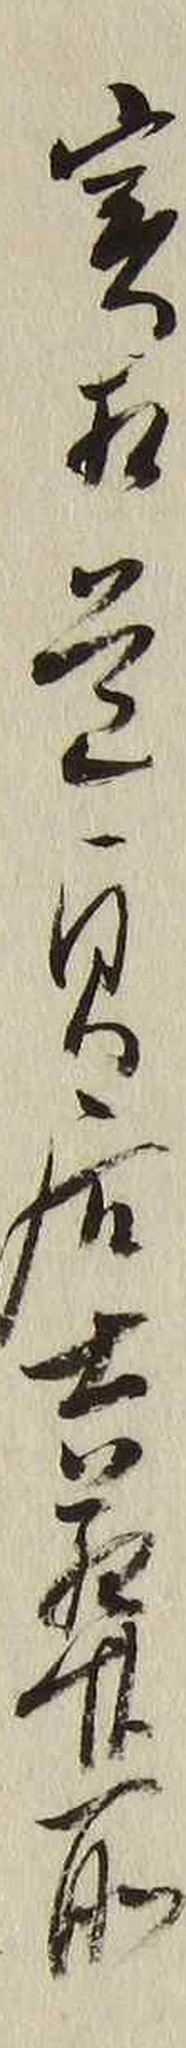実相道貞居士葬所
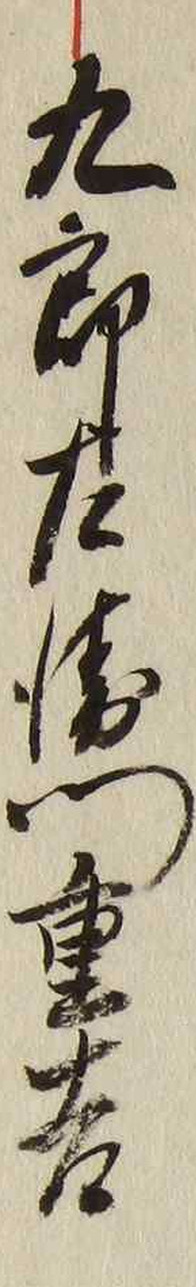九郎左衛門重吉

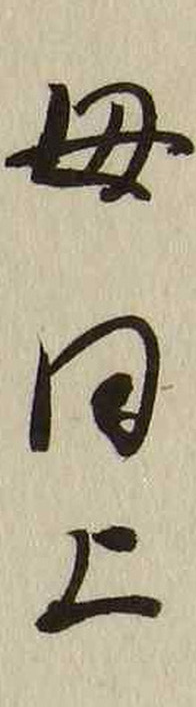母同上
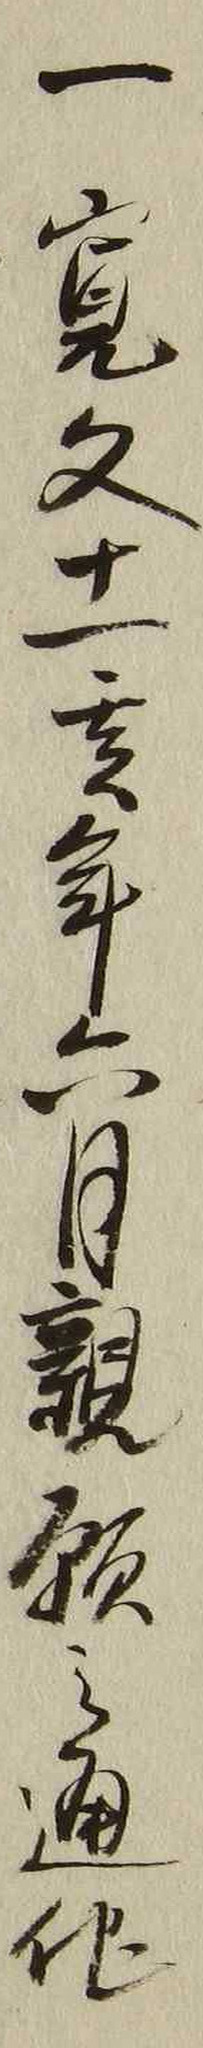一寛文十一亥年六月親願之通他
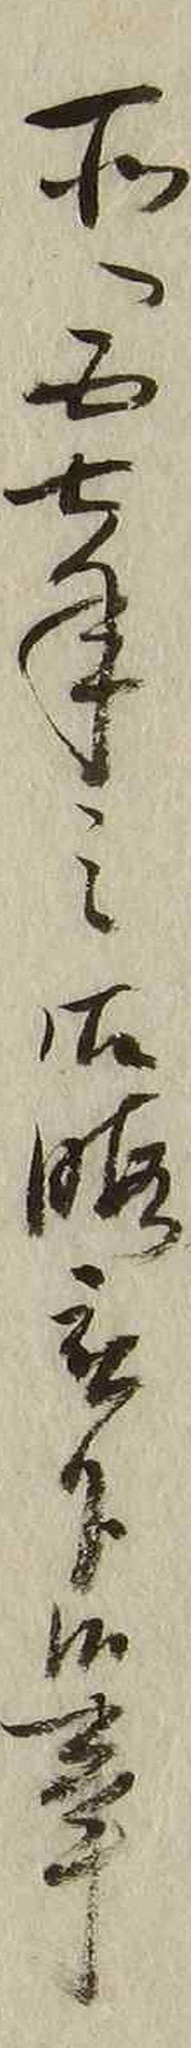所へ五七年之御暇被下候事
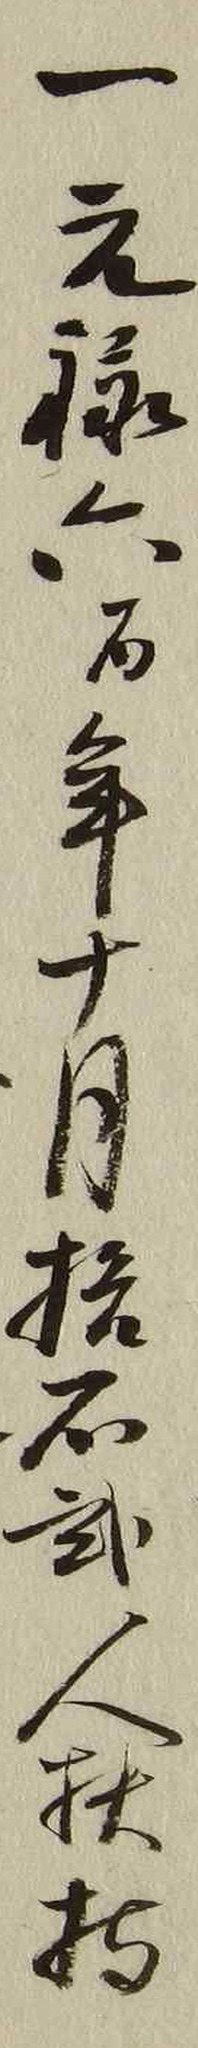一元禄六酉年十月拾石弐人扶持
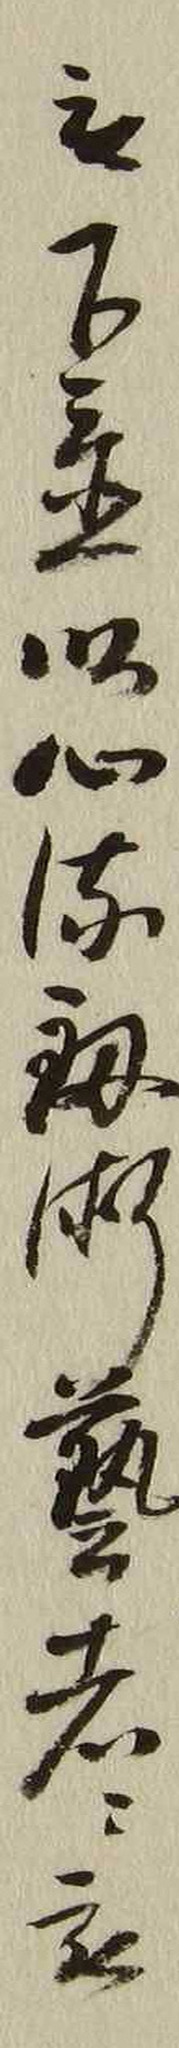被下置以心流剣術芸者ニ被
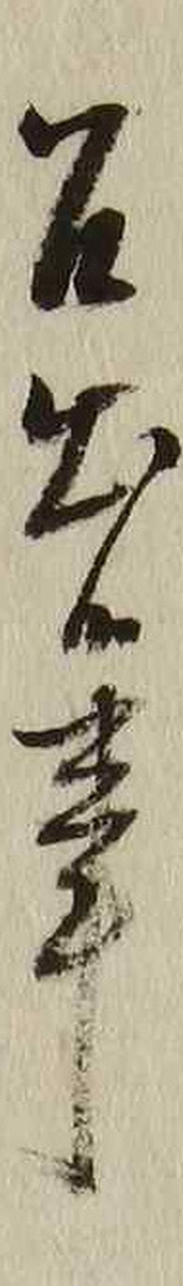召出候事
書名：諸士系譜　巻之355　す之部5
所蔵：会津若松市立会津図書館
